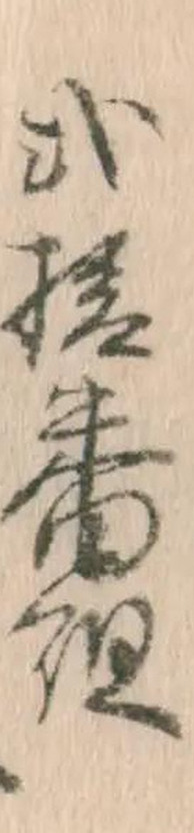弐拾番組
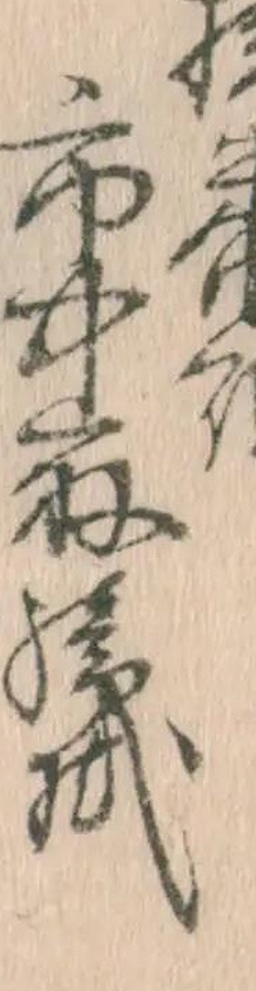市中取締掛

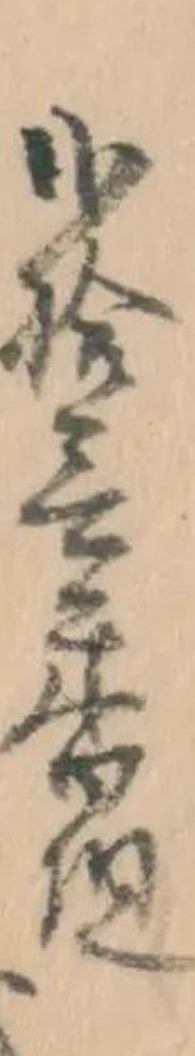弐拾壱番組

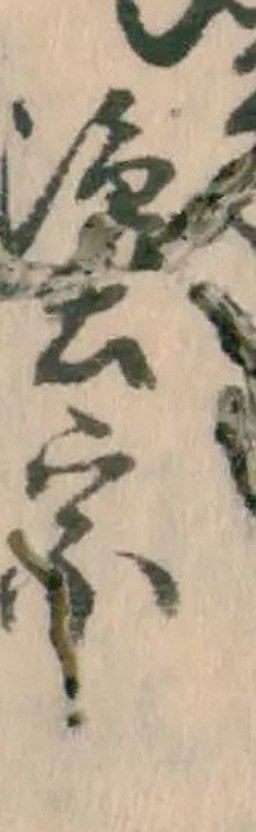浄土宗
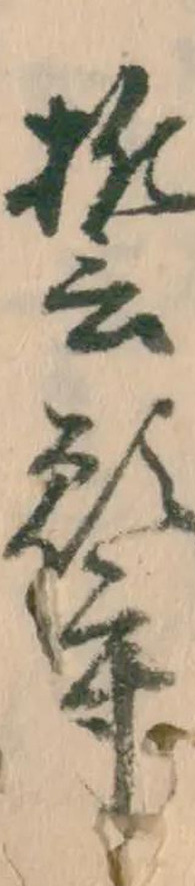誓願寺
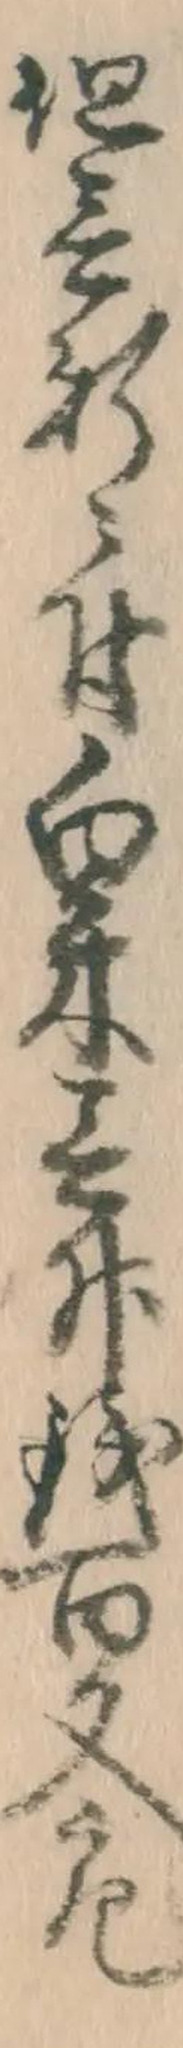但壱軒ニ付白米壱升銭百文宛
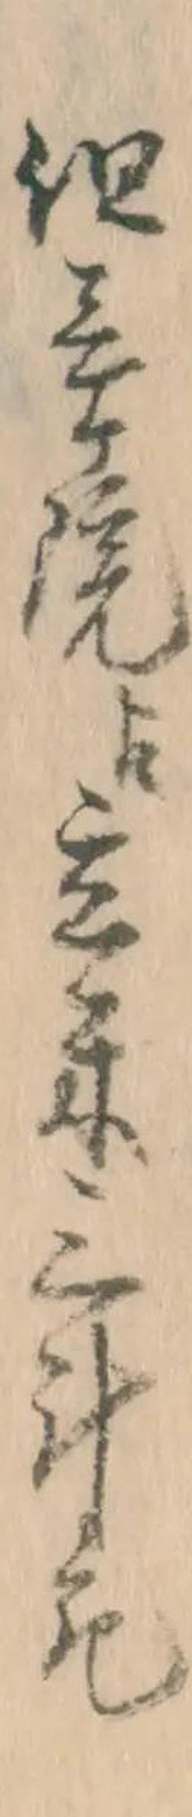但壱ケ院え玄米三斗宛

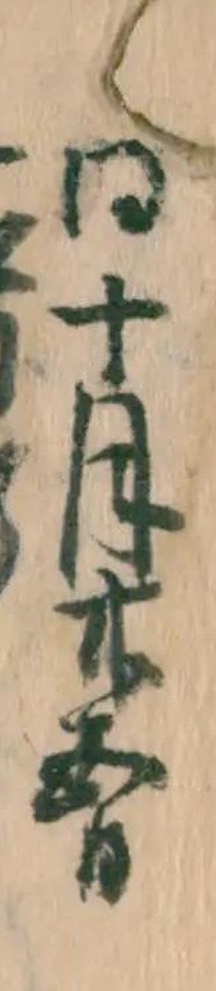同十月廿五日
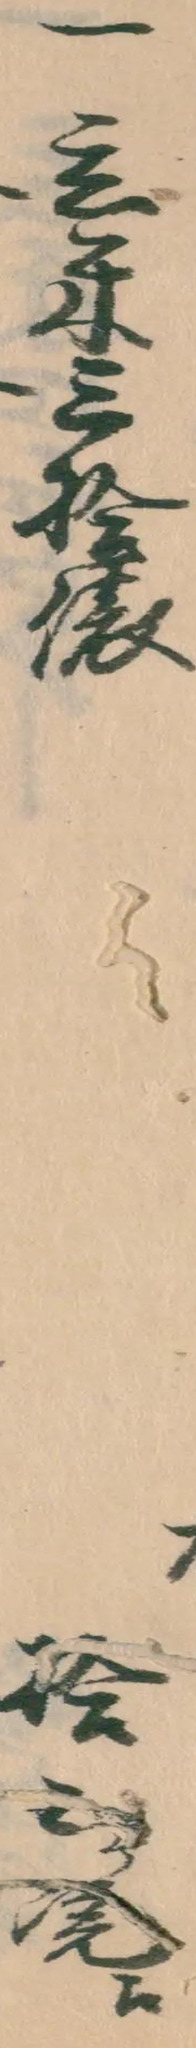一玄米三拾俵拾五ケ院え
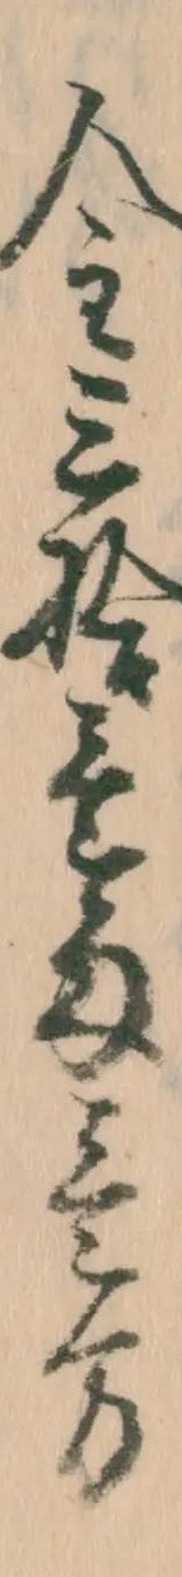金三拾壱両壱分
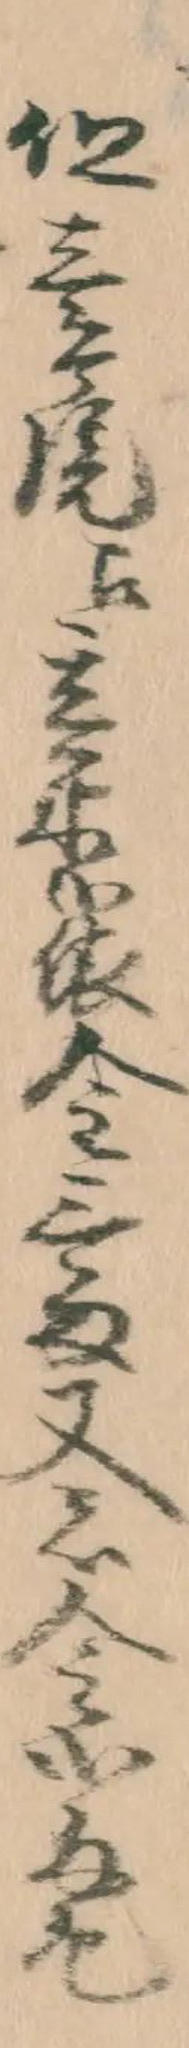但壱院え玄米弐俵金三両又は金弐両宛
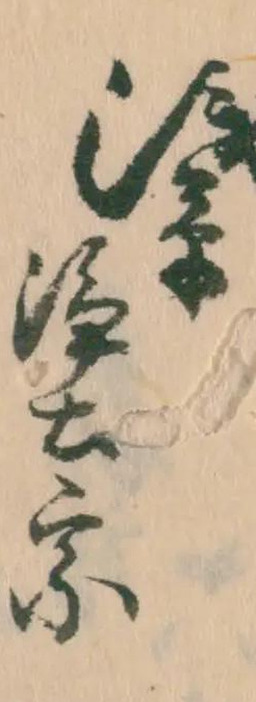浄土宗
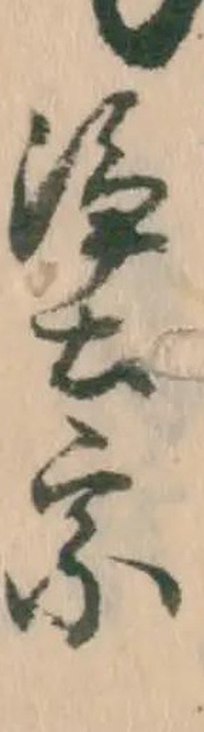浄土宗
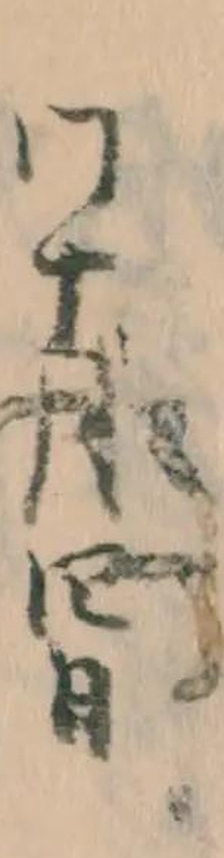同十月四日
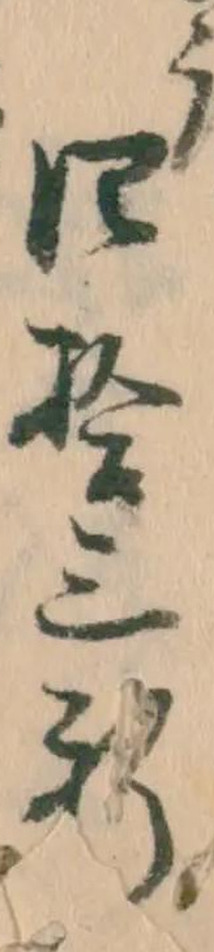六拾三軒
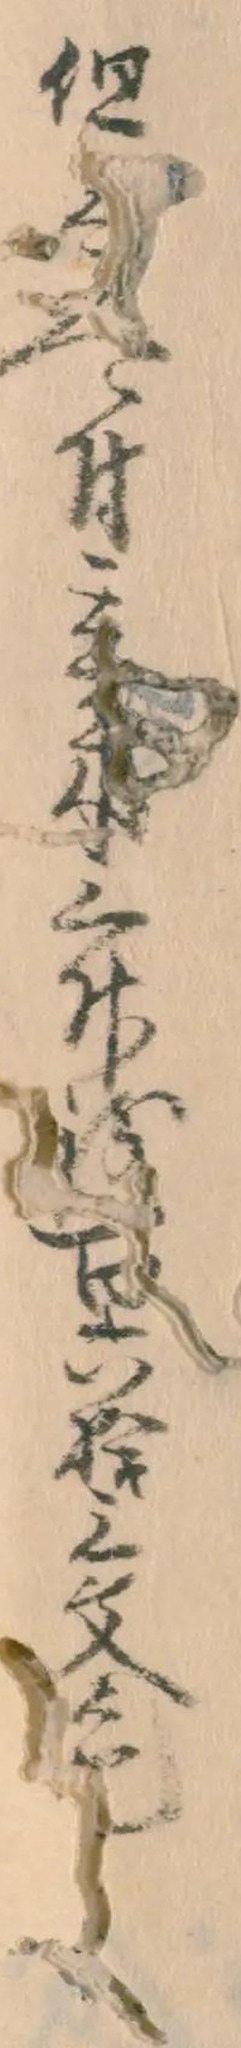但壱軒ニ付玄米三升銭百六拾三文宛
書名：武家方并寺院等ニテ施差出候一件
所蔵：国立国会図書館 National Diet Library, JAPAN
